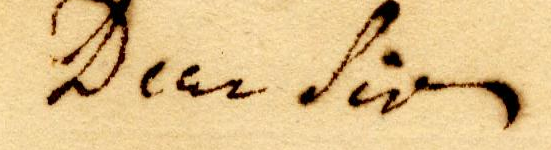Dear Sir
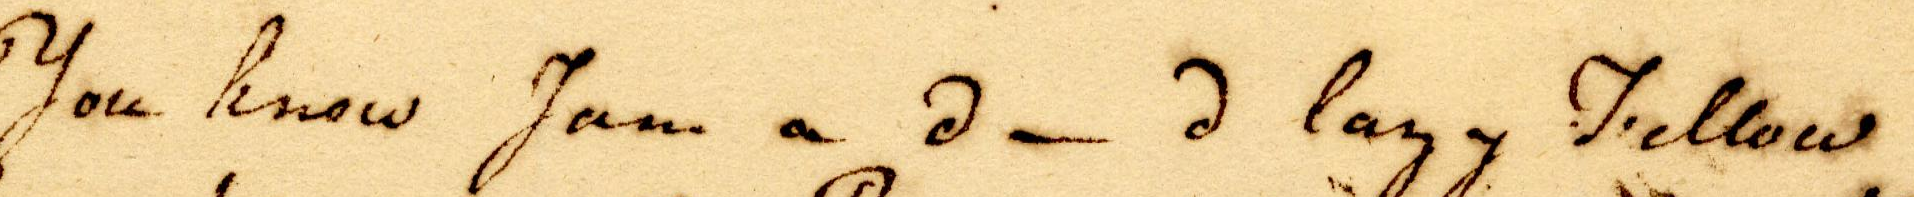You know I am a d----d lazy fellow
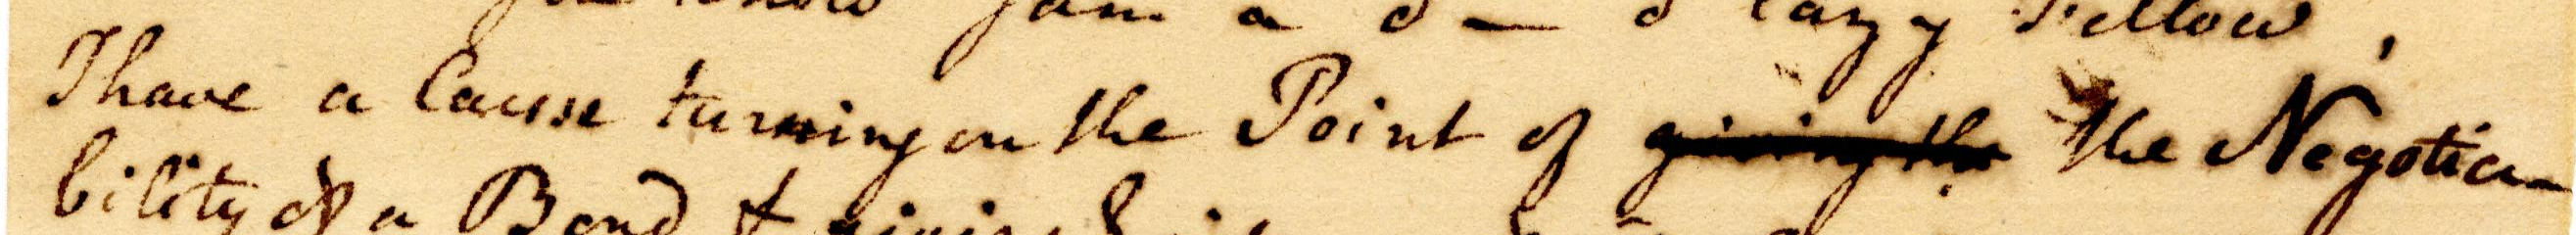I have a Cause turning on the Point of [giving the] the Negotia-
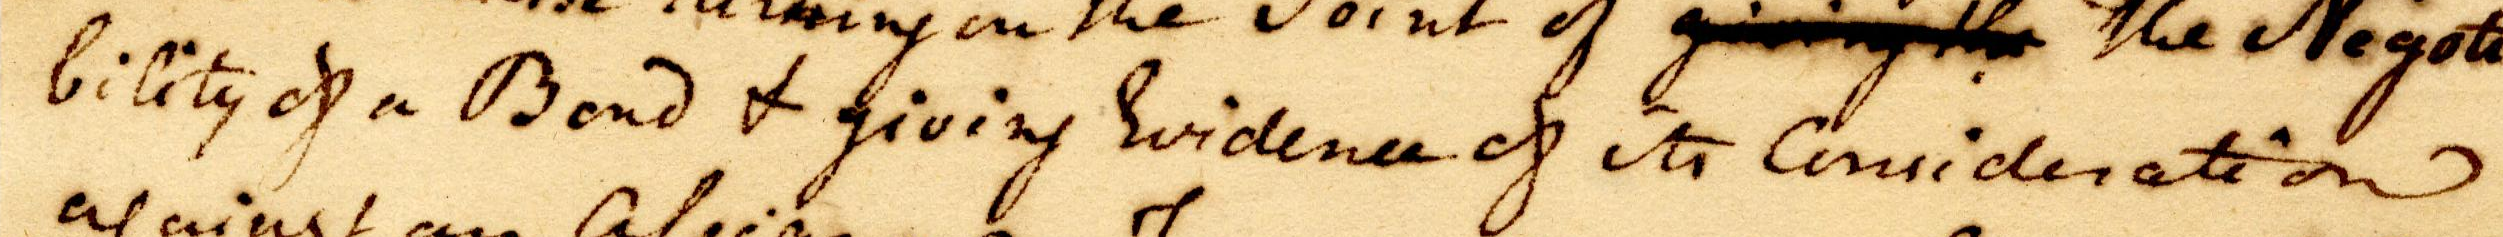-bility of a Bond & giving Evidence of its Consideration
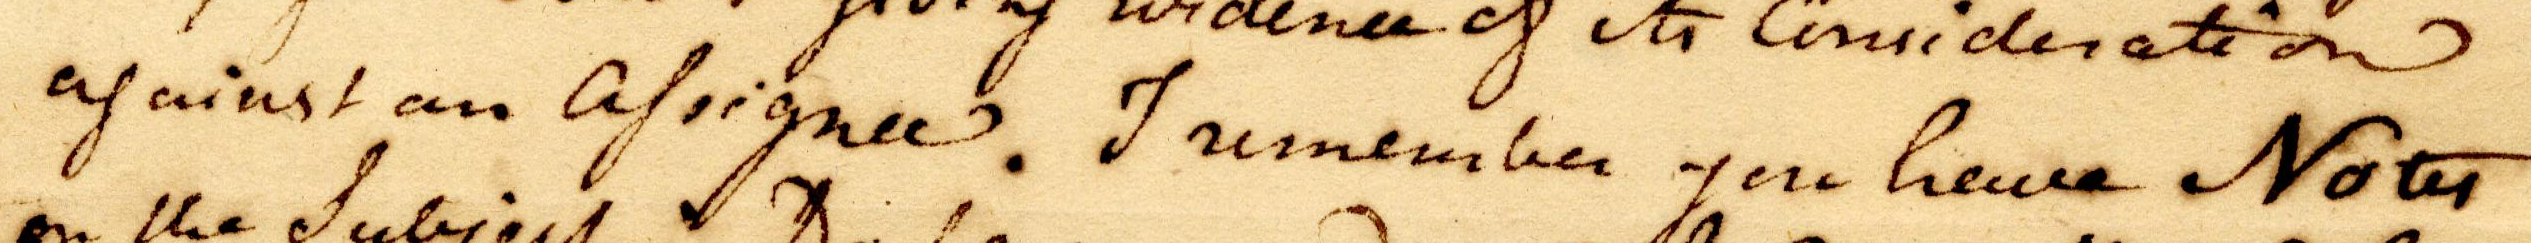against an Assignee. I remember you have Notes
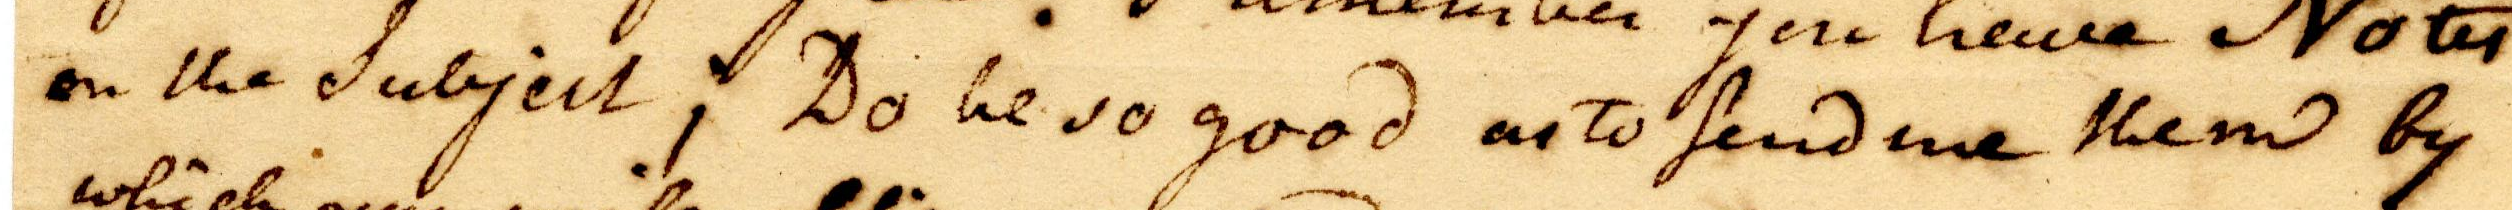on the Subject; Do be so good as to send me them by
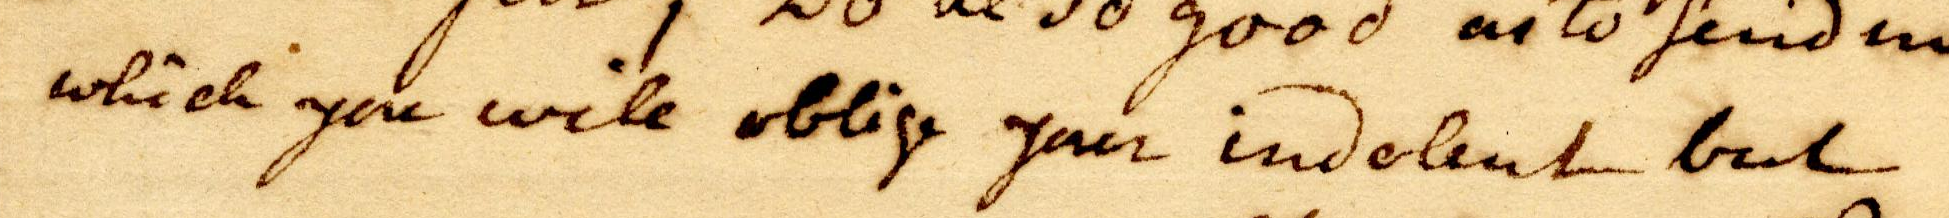which you will oblige your indolent but
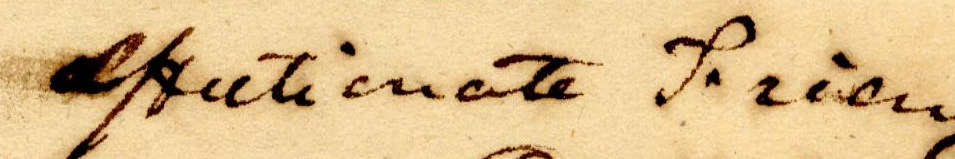Affectionate Friend
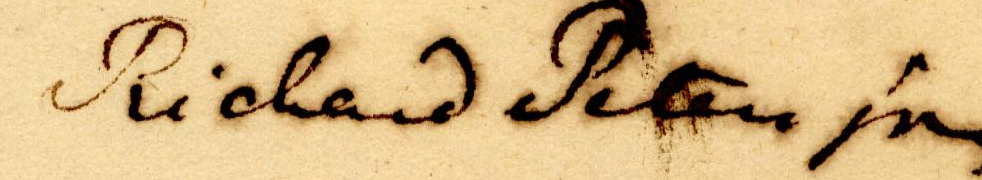Richard Peters Jr
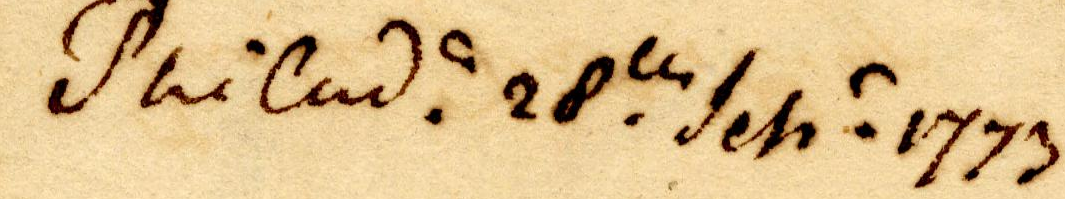Philad^a. 28^th Sep^t. 1773
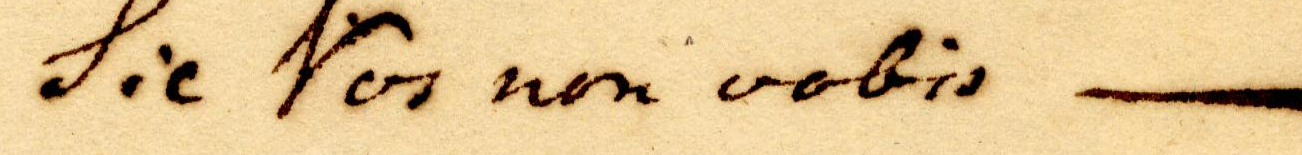Sic Vos non vobis-
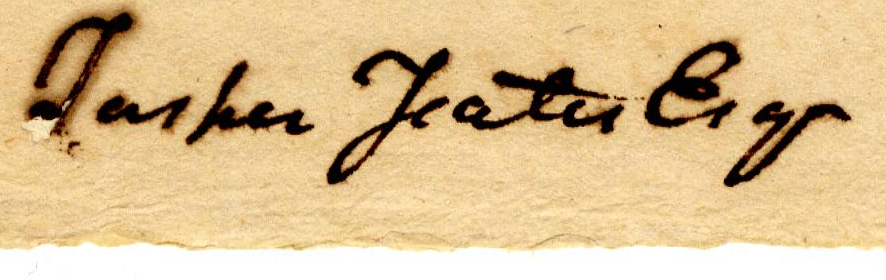Jasper Yeates Esq^r.
